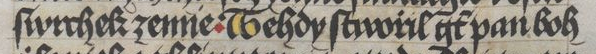ſwrchek zemíe.Tehdy ſtwoṙil ḡt pan boh
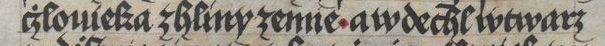ċzlouieka z hlíny zemie.a wdechl wtwarz
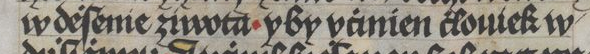w deẛeníe zíwota. yby vċinien ċlouíek w¬
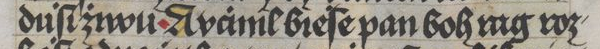dui żiwu. A vċinil bieẛe pan boh rag roz¬
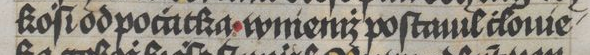koẛí od poċatka. wníemż poſtauil ċlovíe¬
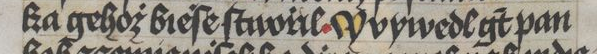ka gehoż bíeẛe ſtwoṙil. Y vywedl ḡt pan
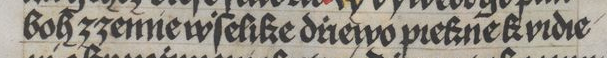boh z zemíe wẛelike dṙiewo piekne k vidie¬
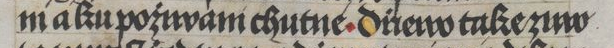ní a ku pożiwaní chutné. Dṙiewo take ziwo¬
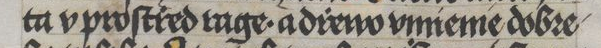ta v proſtṙed rage.a dṙewo vmíeníe dobre¬
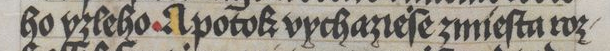ho vzleho. A potok vychazieẛe zmíeſta roz¬
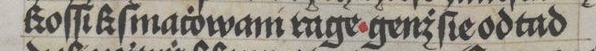koſſi kſinaċowaní rage.genż ſie odtad
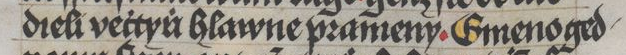dielí veċtyṙi hlawne prameny.Gmeno ged¬
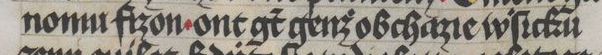nomu fizon.ont ḡt genż obchazie wẛicku
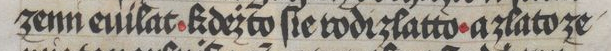zemi euílat. kdeżto ſie rodí zlatto.a zlato ze¬
